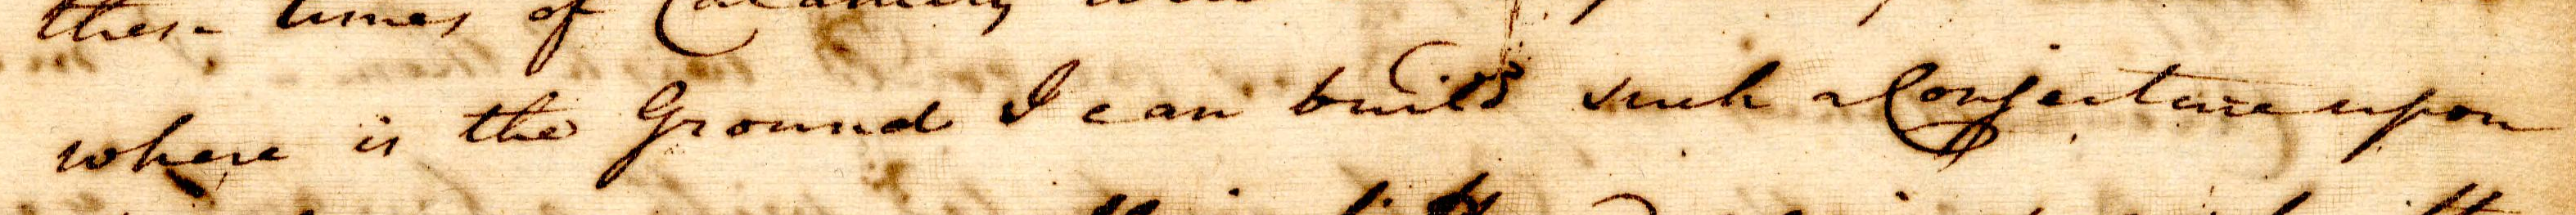where is the Ground I can build such Conjecture upon
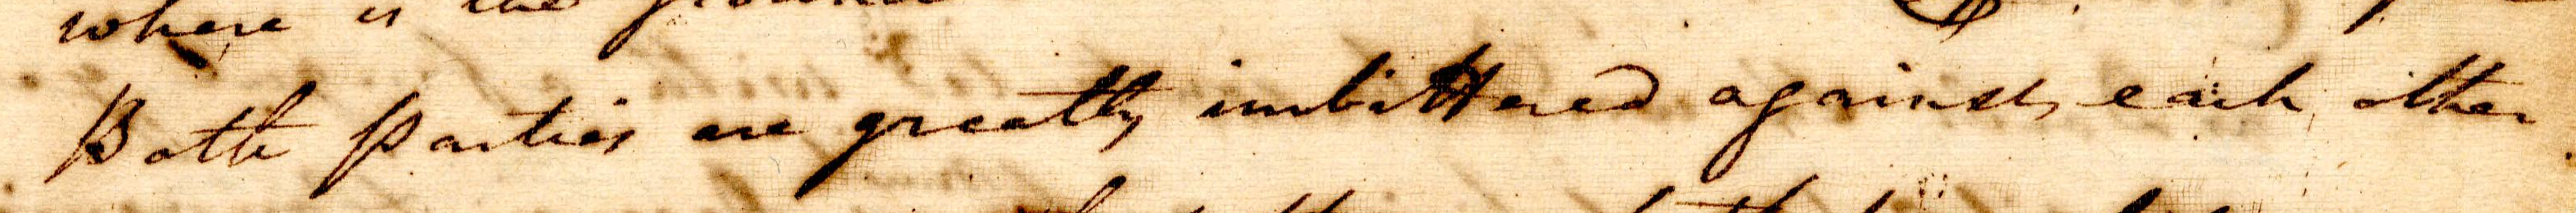Both parties are greatly imbittered against each other
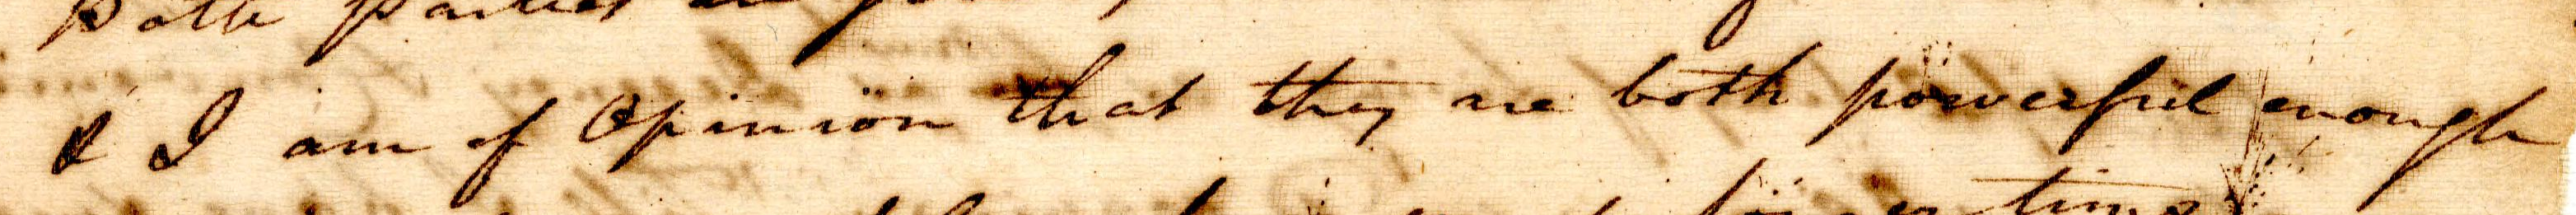& I am of Opinion that they are both powerful enough
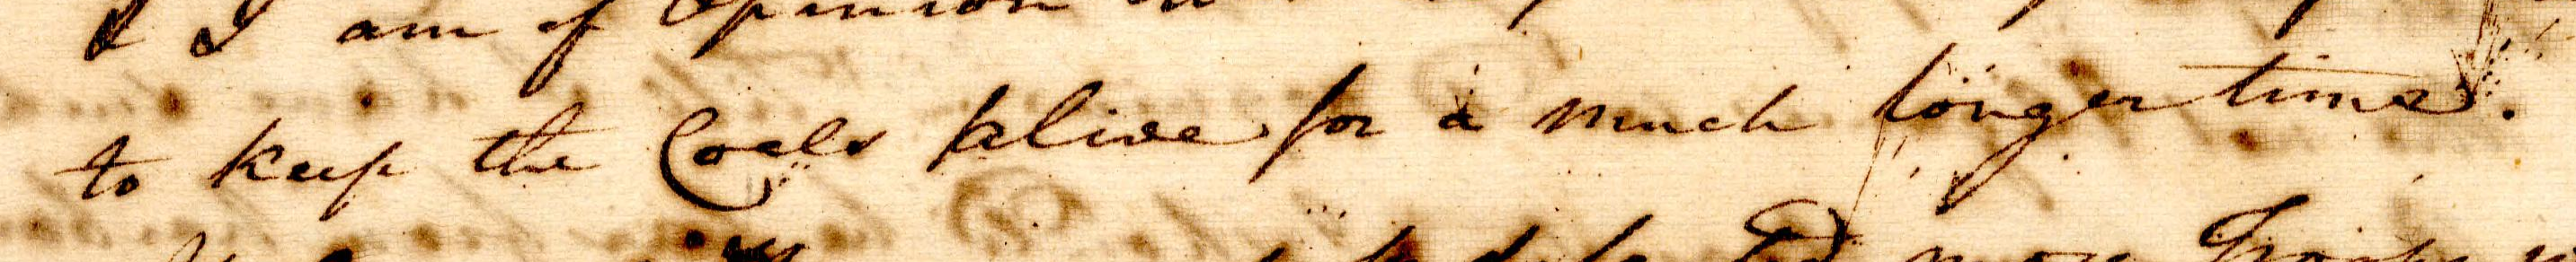to keep the Coals alive for a much longer time.
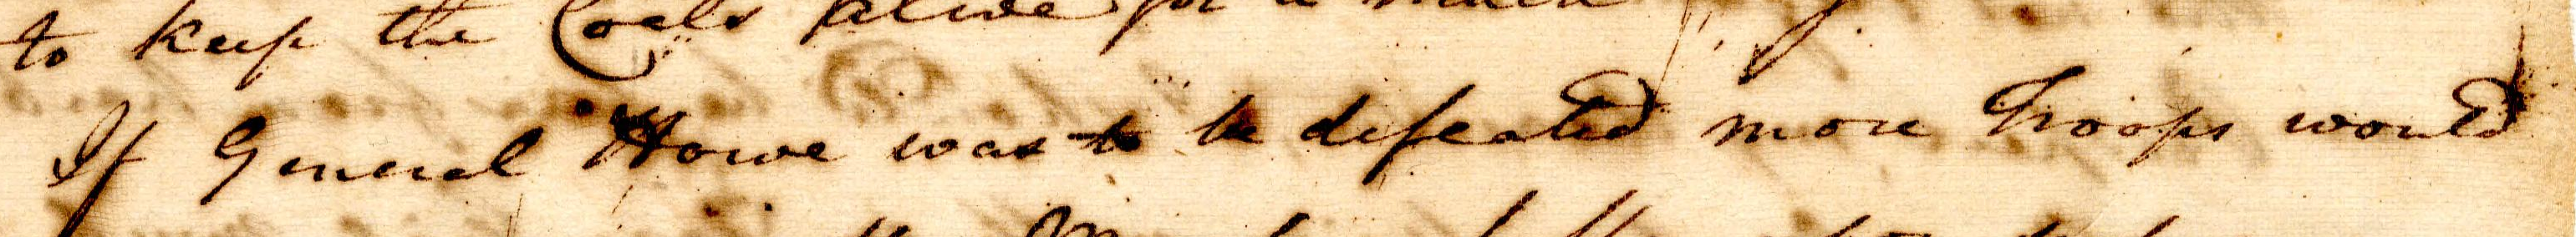If General Howe was to be defeated more Troops would
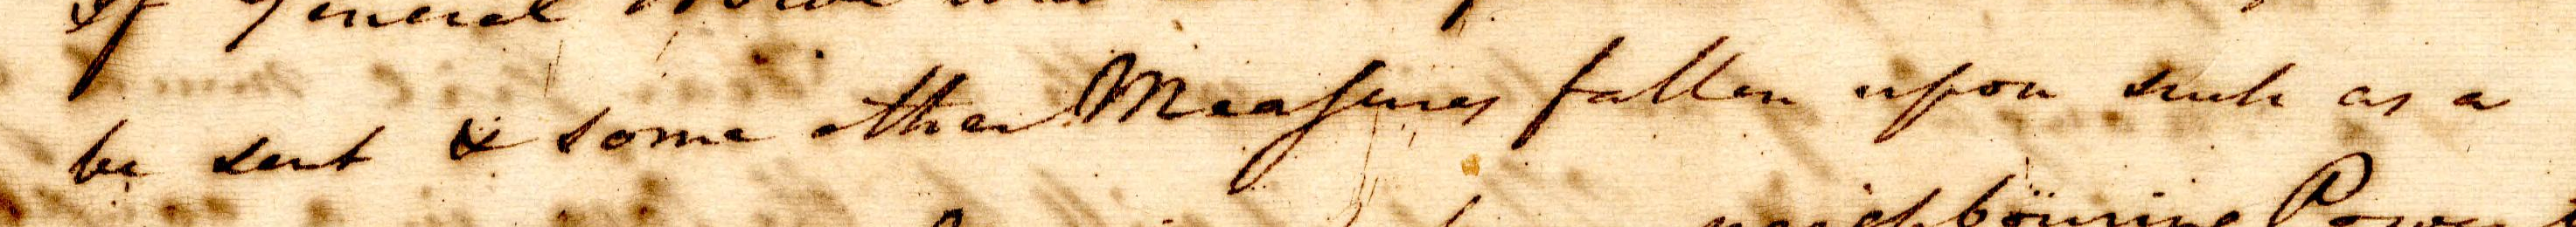be sent & some other Measures fallen upon such as a
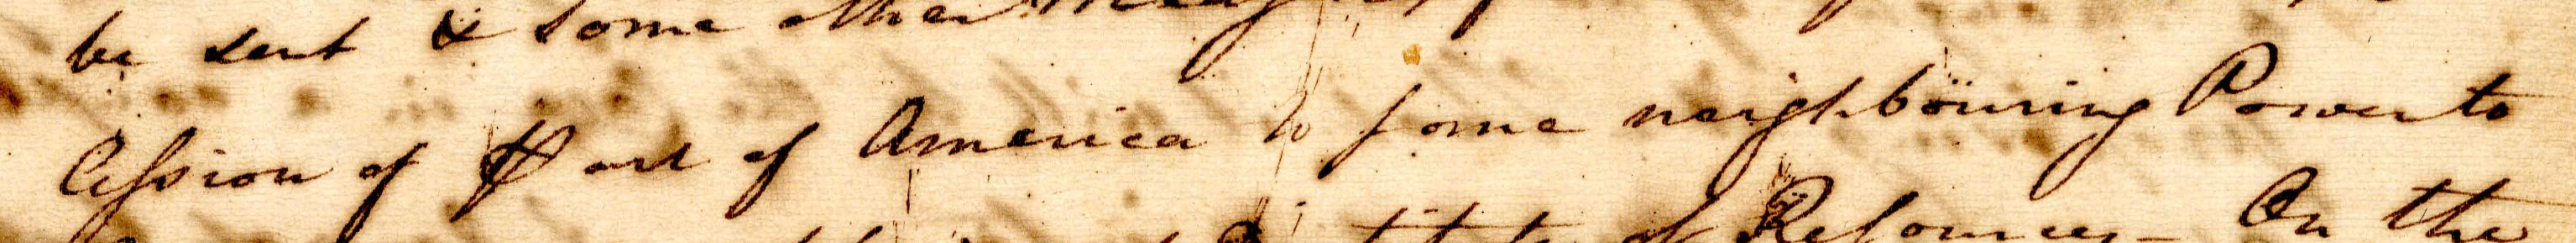Cession of per out of America to some neighbouring Power to
